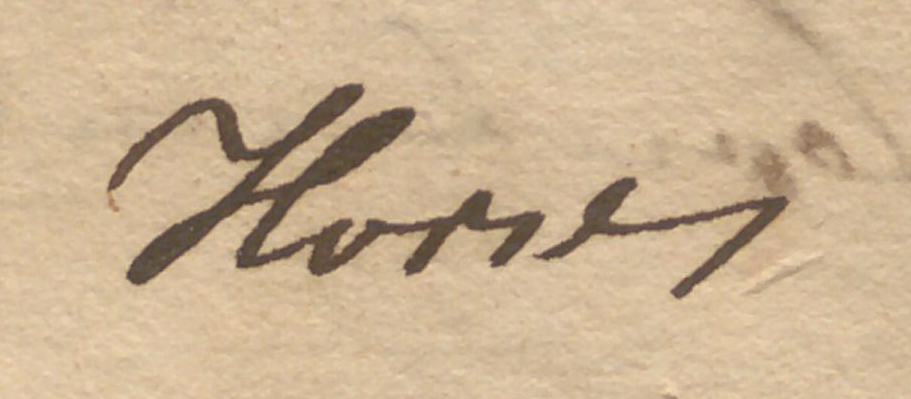Horses
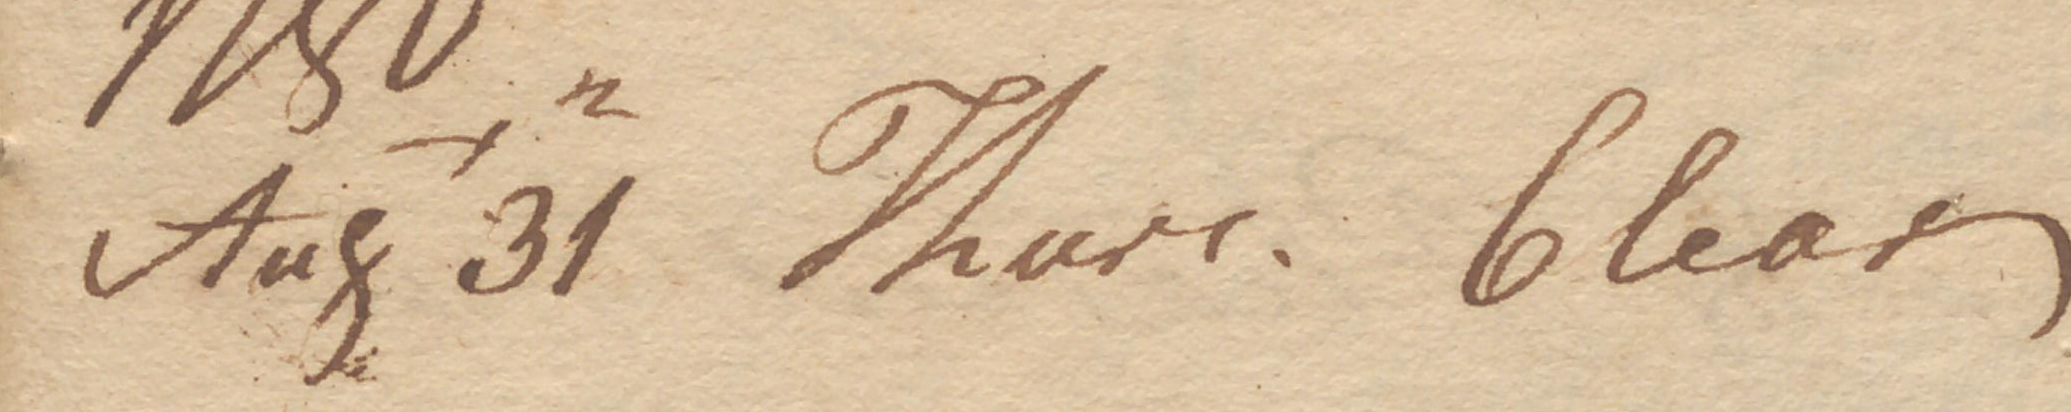Aug^t 31^th Thurs. Clear
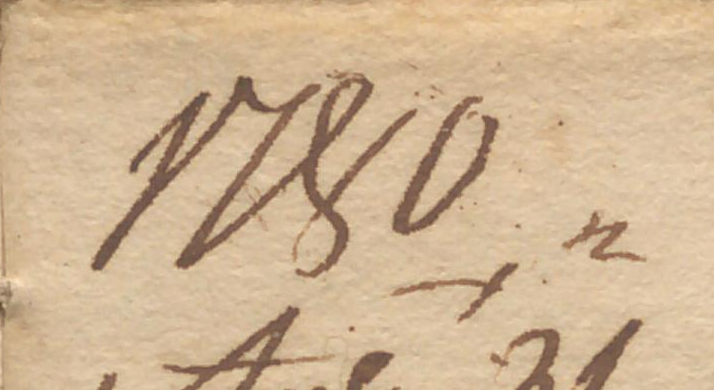1780
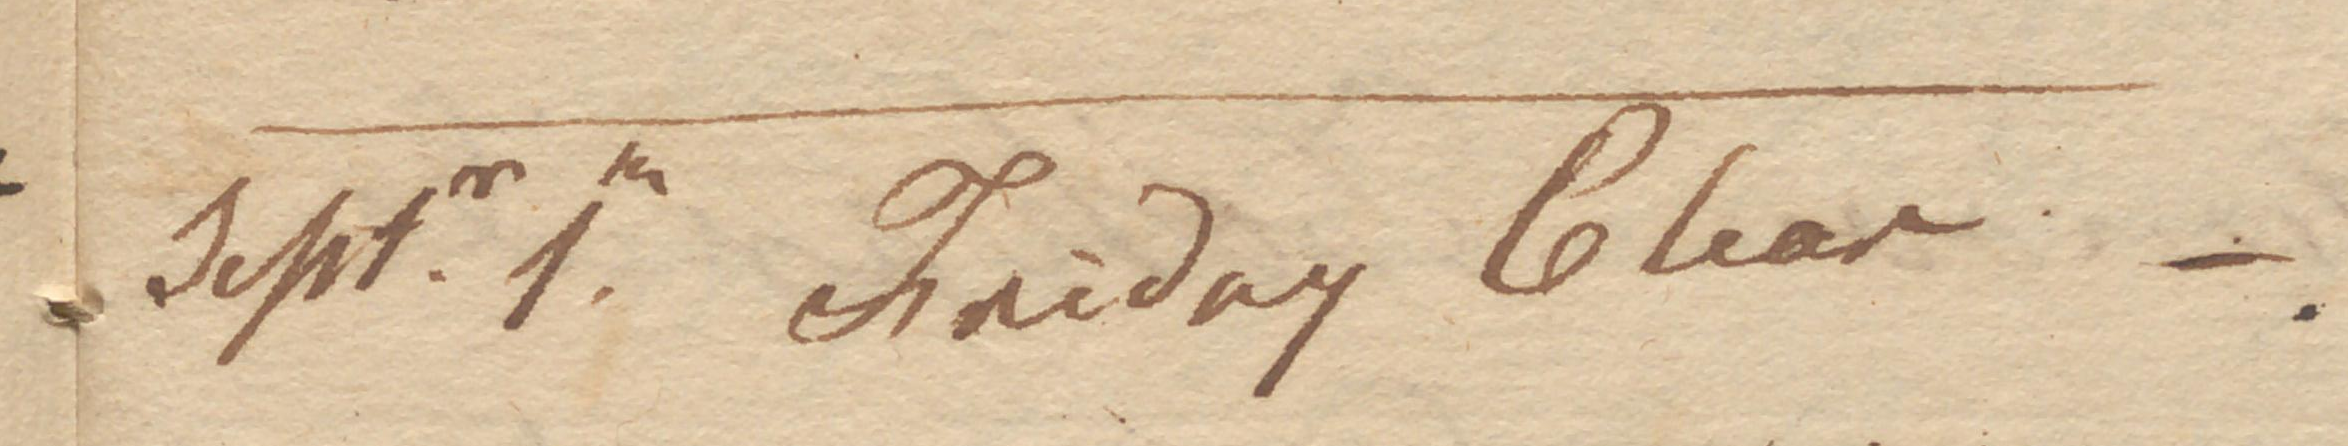Sept^r. 1^th. Friday Clear
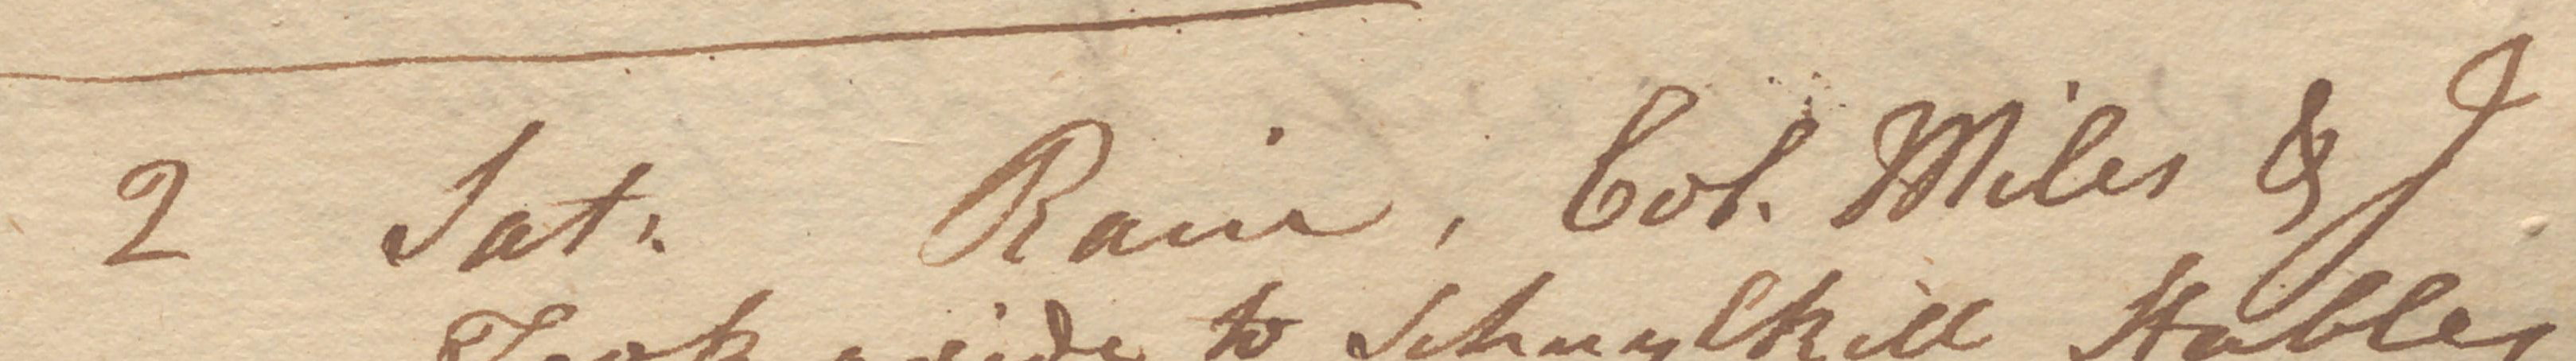2 Sat. Rain, Col. Miles & I
